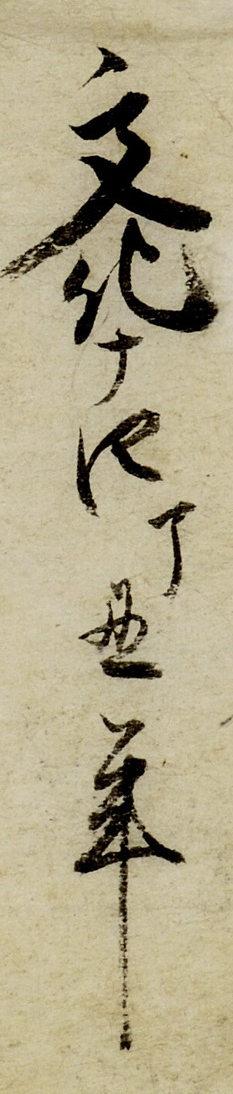文化十四丁丑年
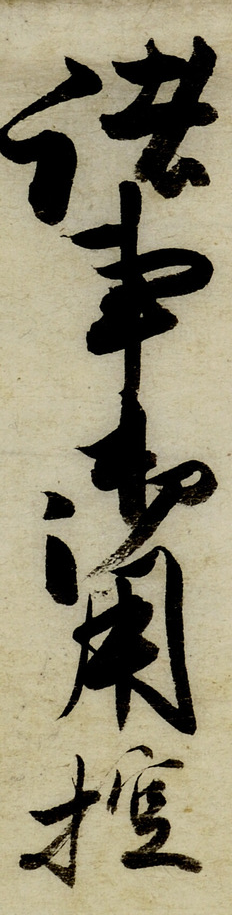諸事御用控
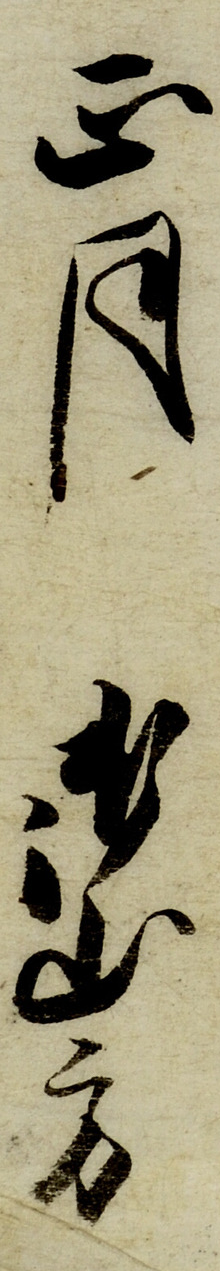正月御山方
